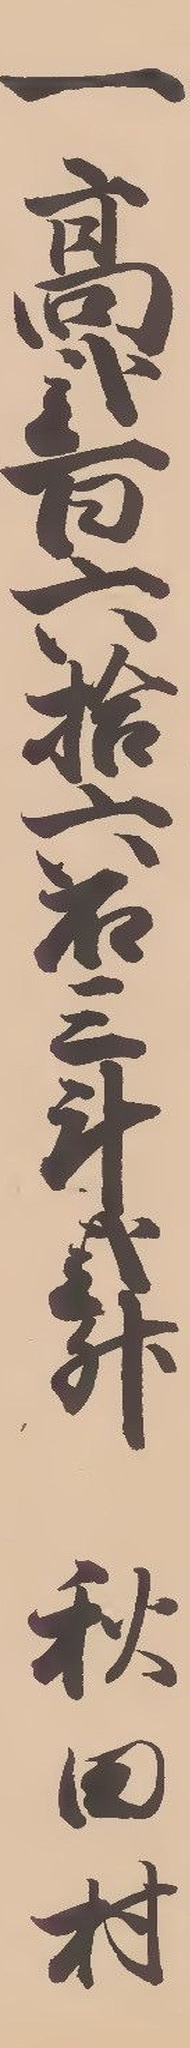一高弐百六拾六石三斗弐升秋田村
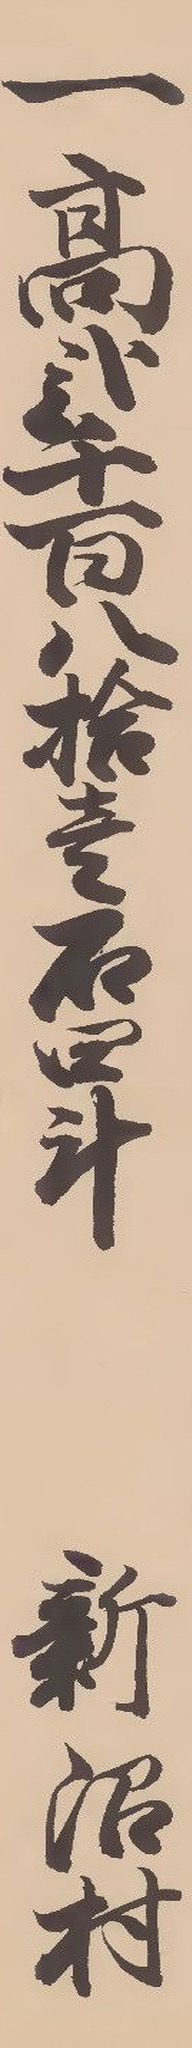一高弐千百八拾壱石四斗新沼村
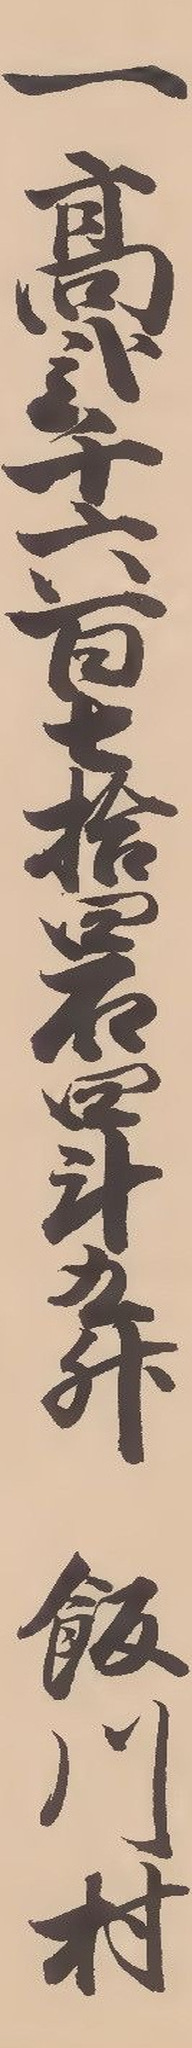一高弐千六百七拾四石四斗九升飯川村
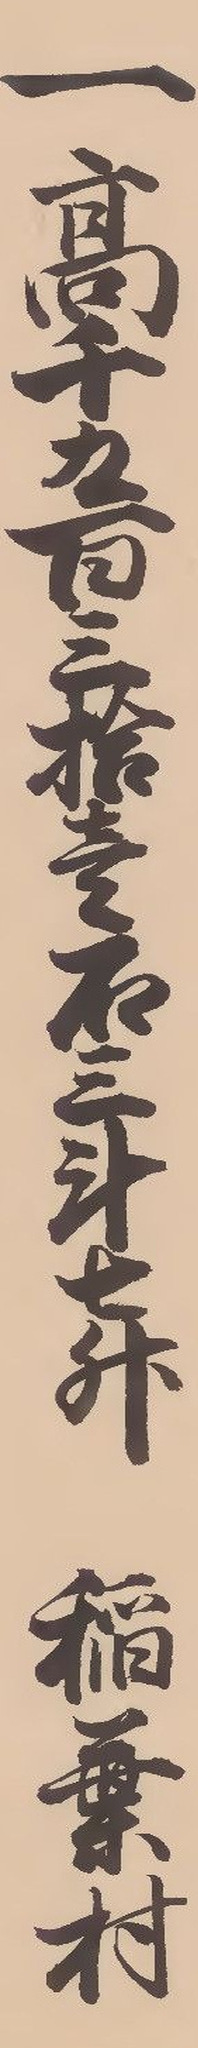一高千九百三拾壱石三斗七升稲葉村
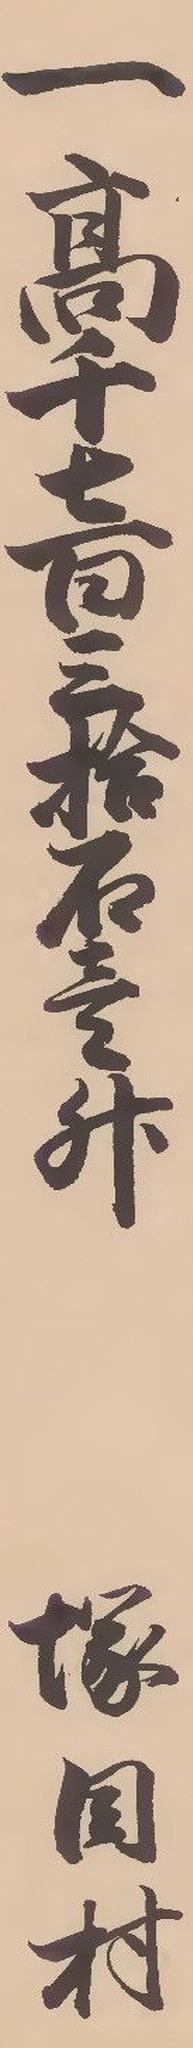一高千七百三拾石壱升塚目村

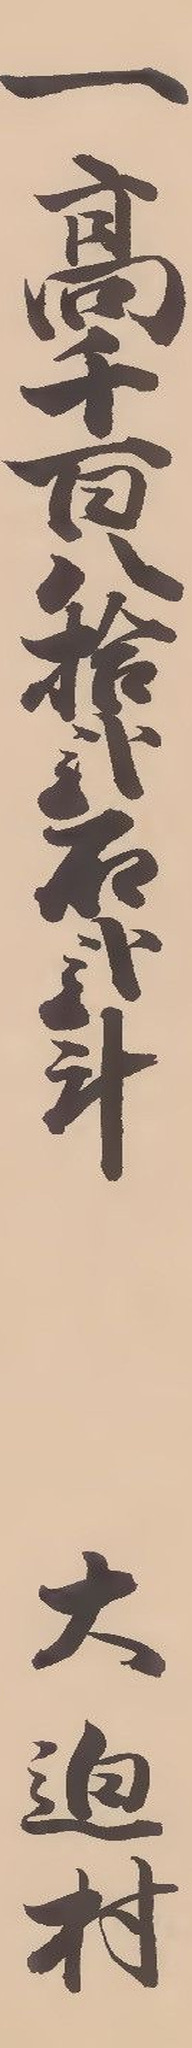一高千百八拾弐石弐斗大迫村
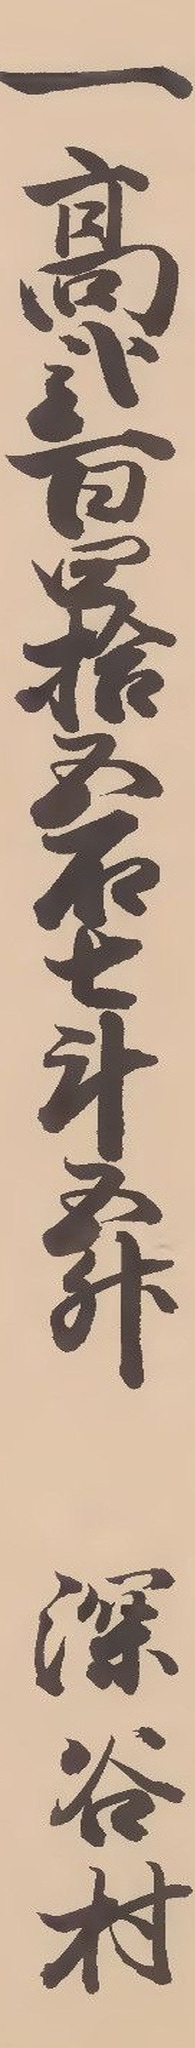一高弐百四拾五石七斗五升深谷村
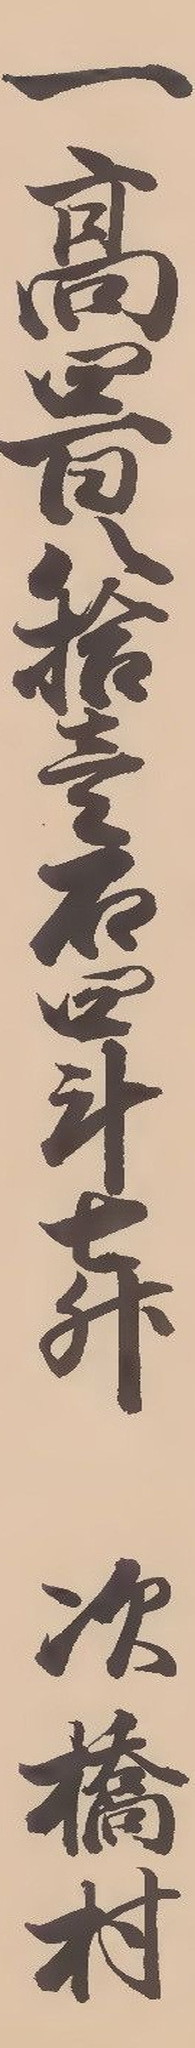一高四百八拾壱石四斗七升次橋村
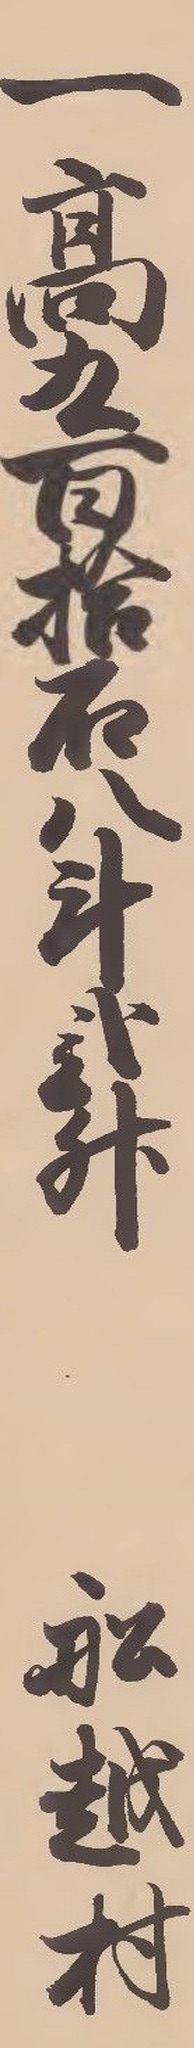一高九百拾石八斗弐升船越村
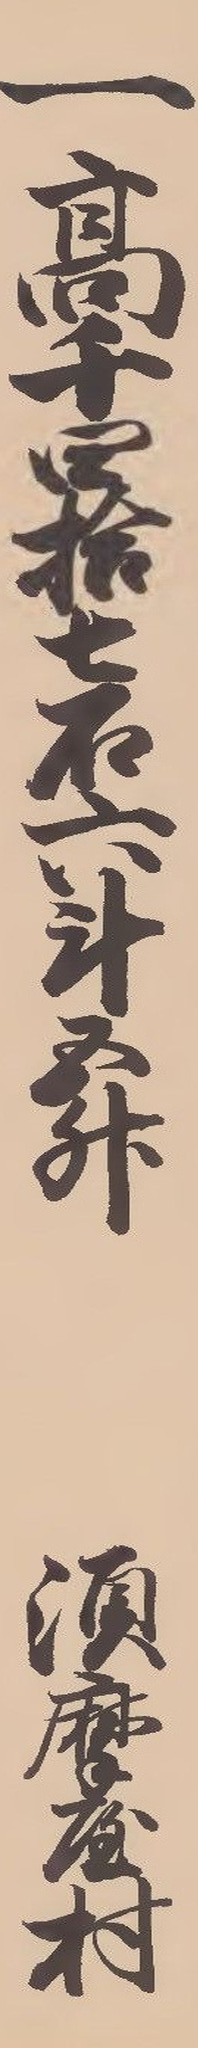一高千四拾七石六斗五升須磨屋村
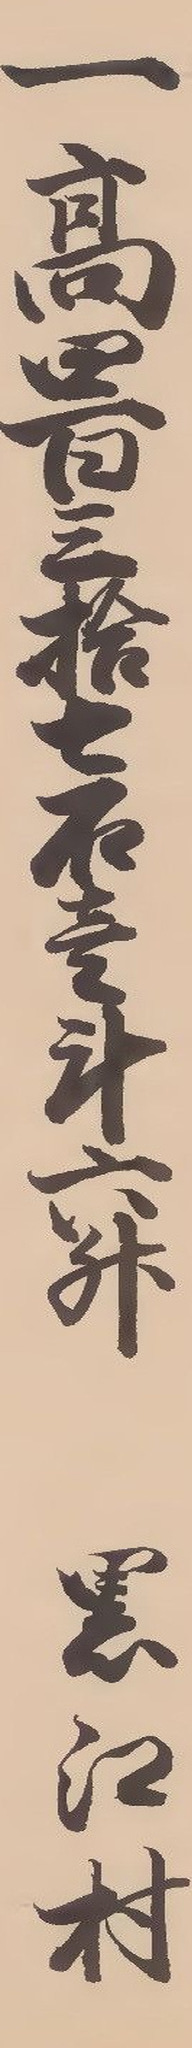一高四百三拾七石壱斗六升黒江村
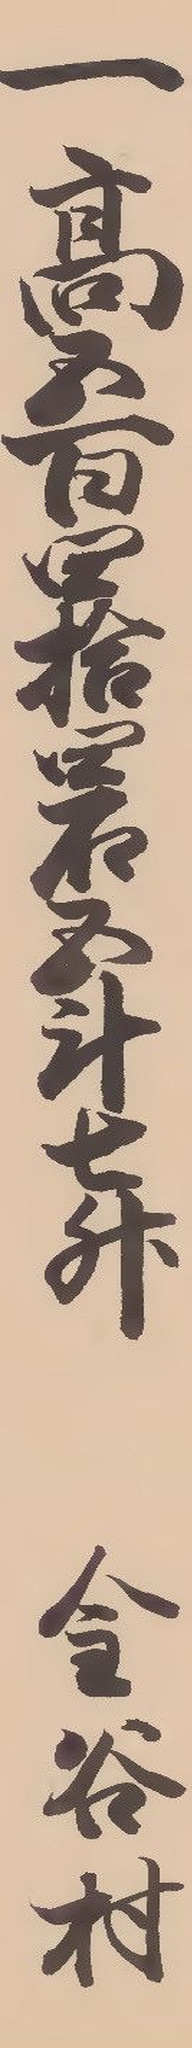一高五百四拾四石五斗七升金谷村
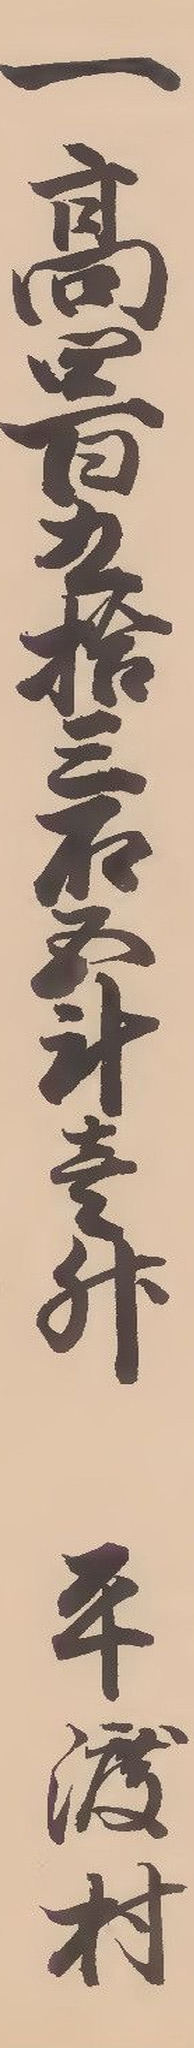一高四百九拾三石五斗壱升平渡村

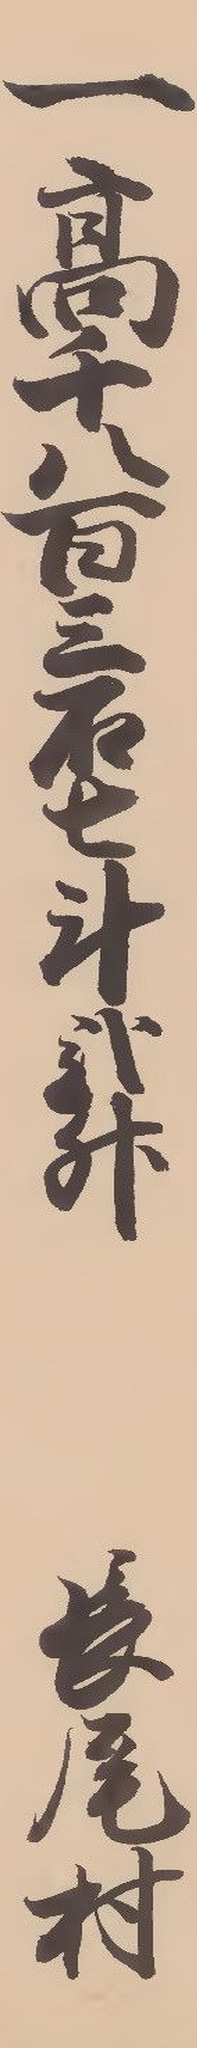一高千八百三石七斗弐升長尾村
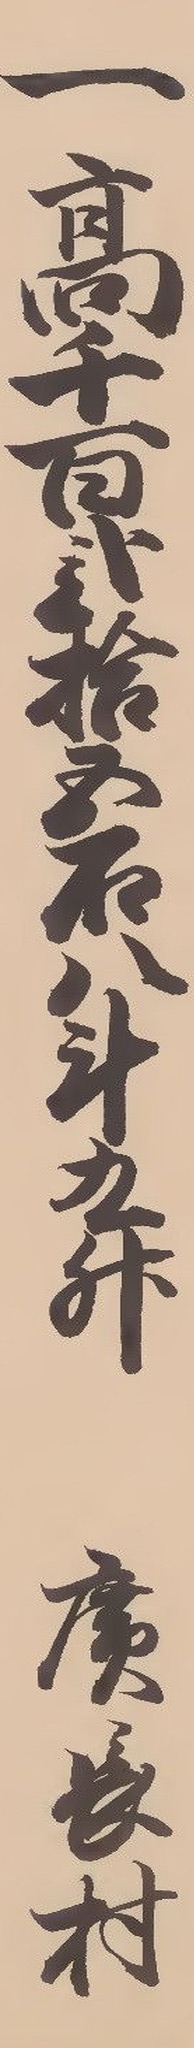一高千百弐拾五石八斗九升広長村
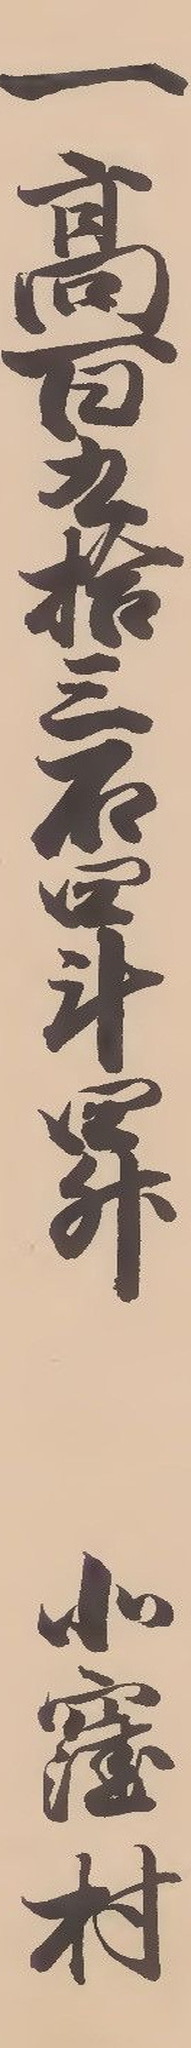一高百九拾三石四斗四升北窪村
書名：陸奥国郷帳　５
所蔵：国立公文書館 National Archives of Japan
